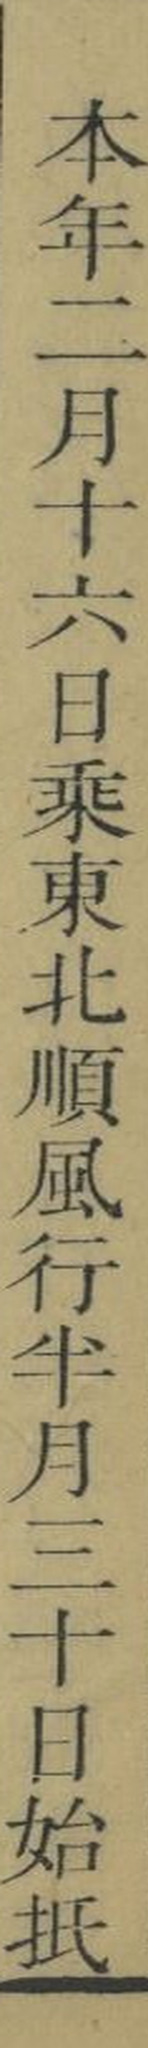本年二月十六日乘東北順風行半月三十日始扺
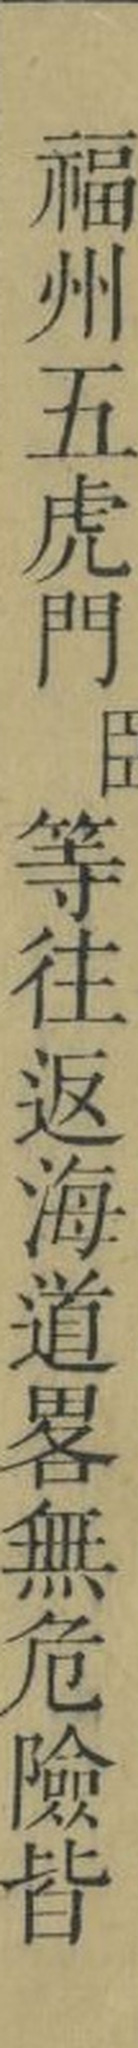福州五虎門臣等往返海道畧危險皆
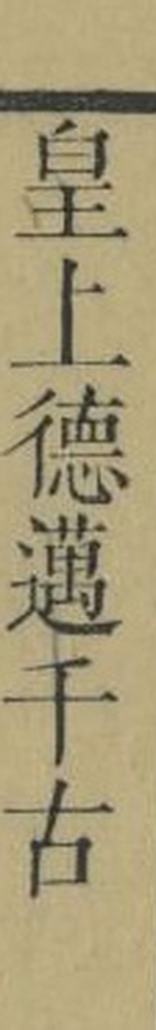皇上德邁千古
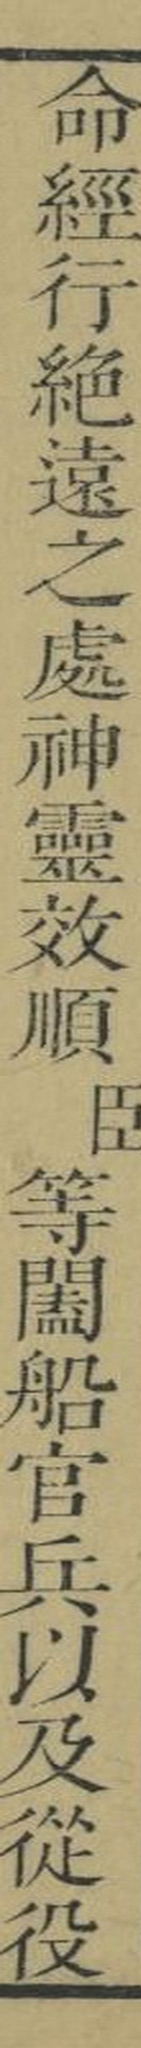命經行絶遠之處神靈效順臣等闔船官兵以及從役
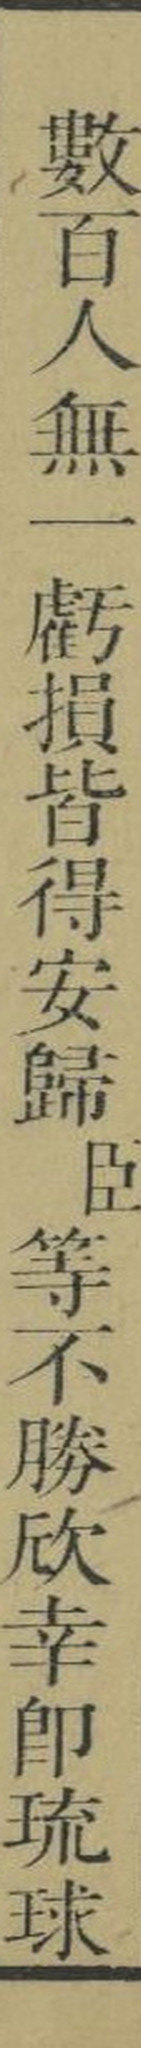數百人無一虧損皆得安歸臣等不勝欣幸卽琉球
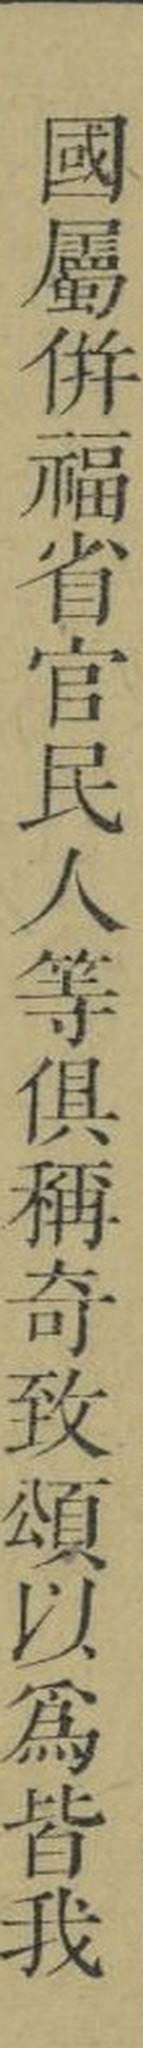國屬倂福省官民人等俱稱奇致頌以爲皆我
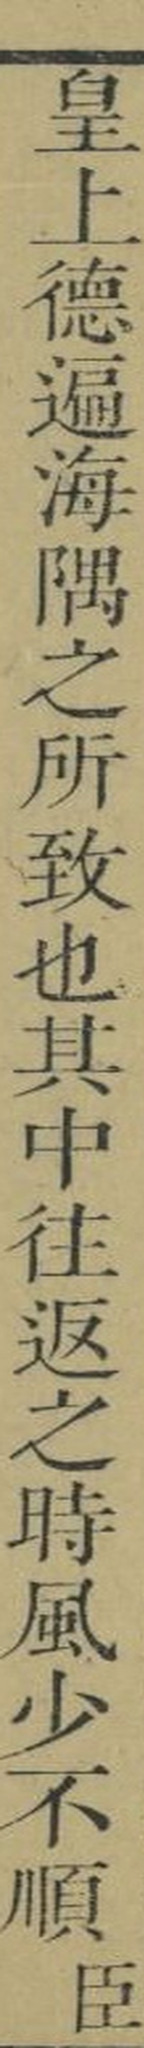皇上德遍海隅之所致也其中往返之時風少不順臣
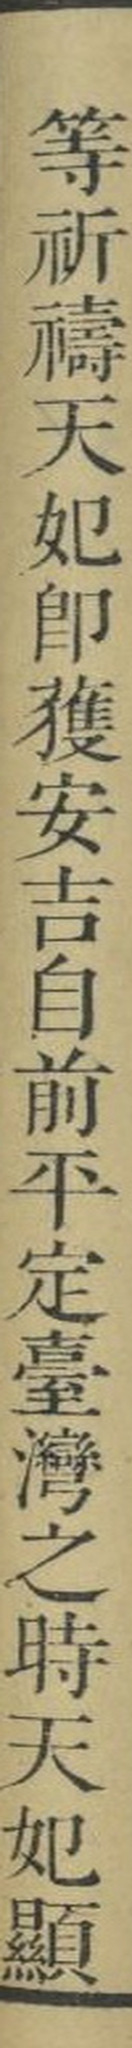等祈禱天妃卽獲安吉自前平定臺灣之時天妃顯
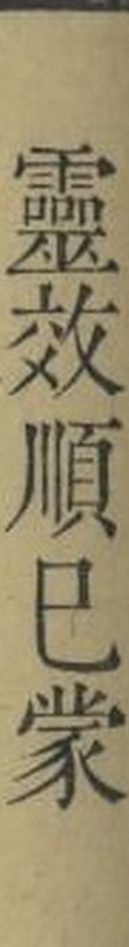靈效順巳蒙
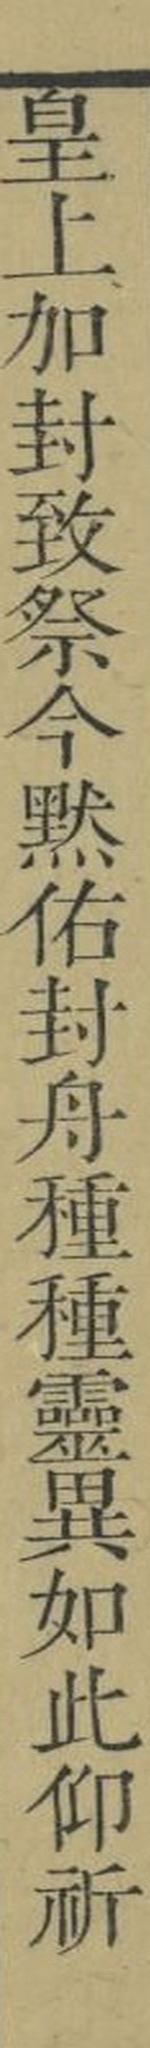皇上加封致祭今默佑封舟種種靈異如此仰祈
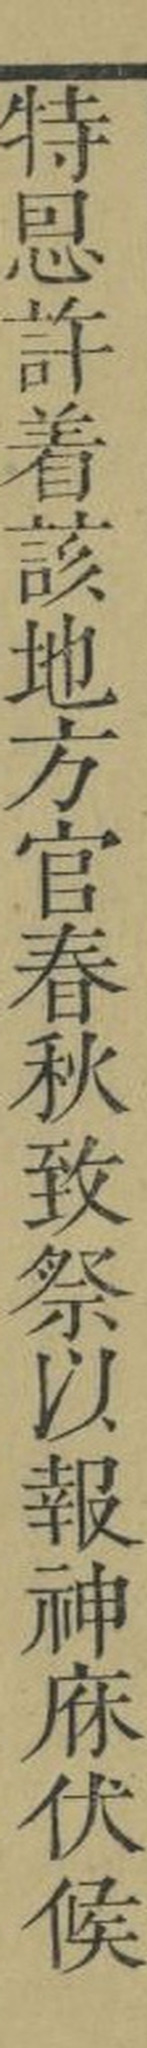特㤙許着該地方官春秋致祭以報神庥伏候
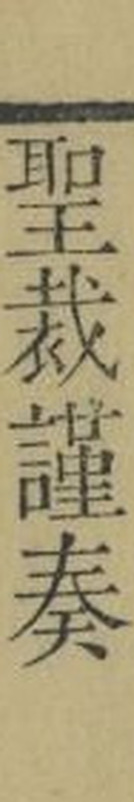聖裁謹奏
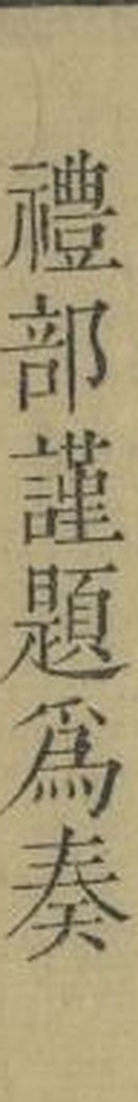禮部謹題爲奏
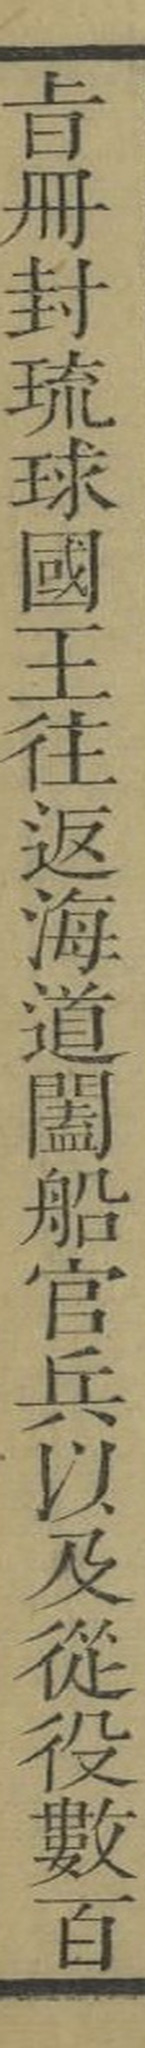㫖冊封琉球國王往返海道闔船官兵以及從役數百

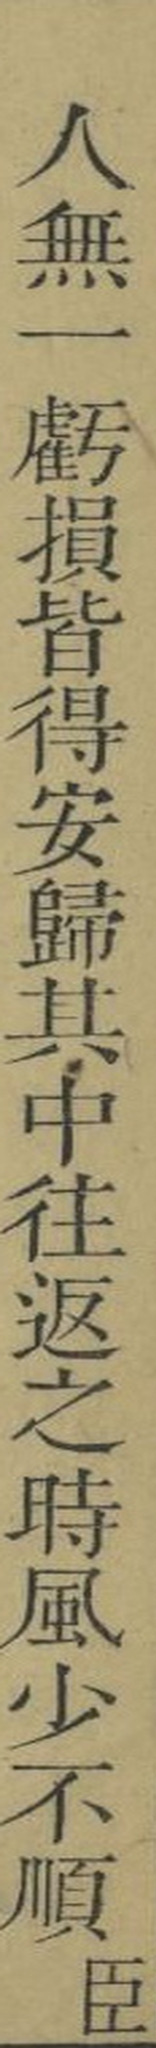人無一虧損皆得安歸其中往返之時風少不順臣
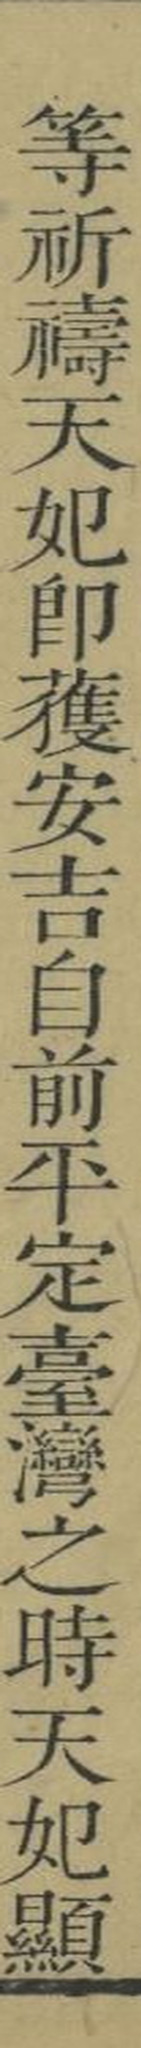等祈禱天妃卽獲安吉自前平定臺灣之時天妃顯
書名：中山伝信録 巻一
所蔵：University of the Ryukyus Library
